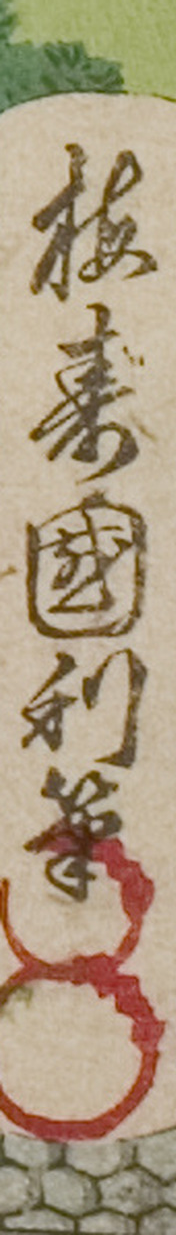梅寿国利筆

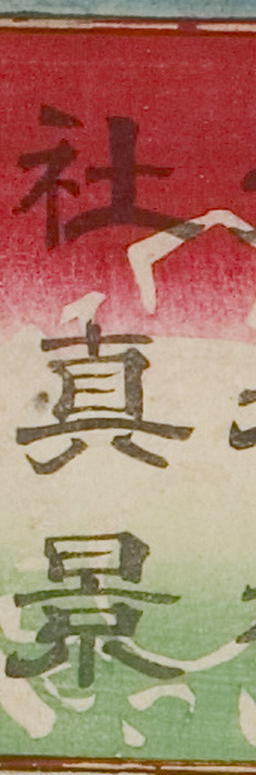社真景
